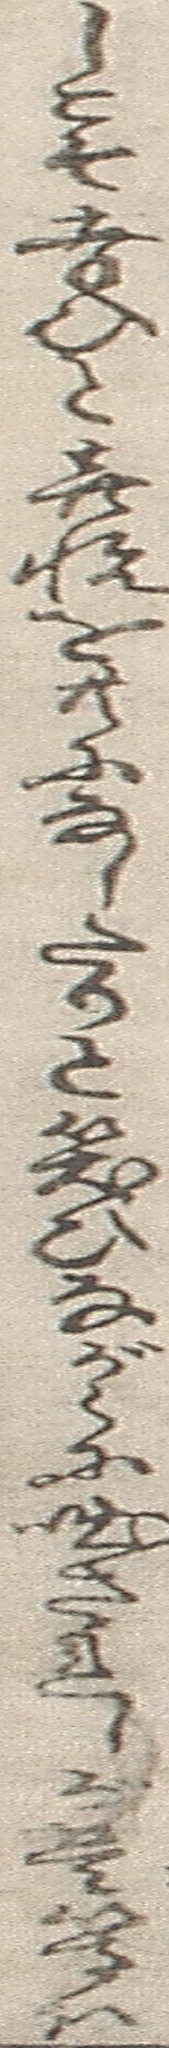しこそ幸ひと喜悦を共になしたりと笑ひながらに咄されしが是等ハ

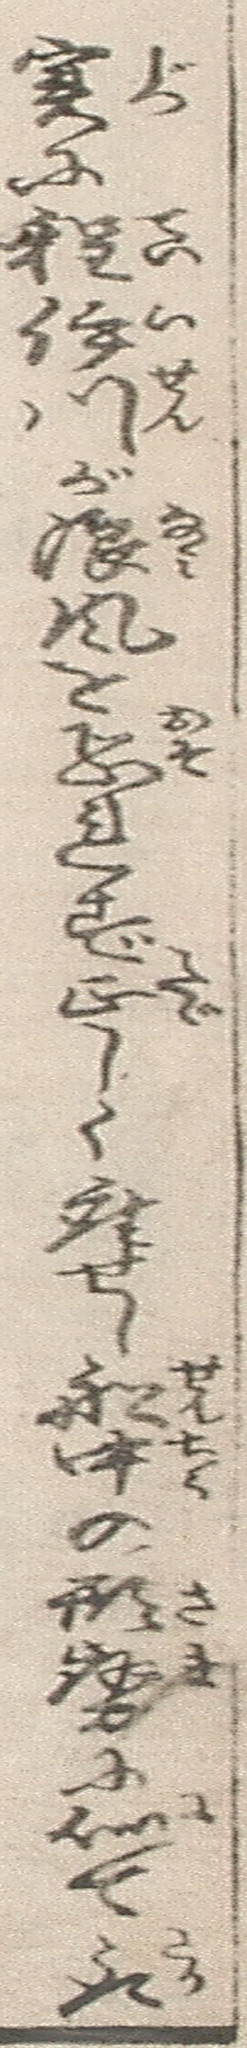実に程伊川が浪風を恐れず正しく座せし船中の形勢に似て取
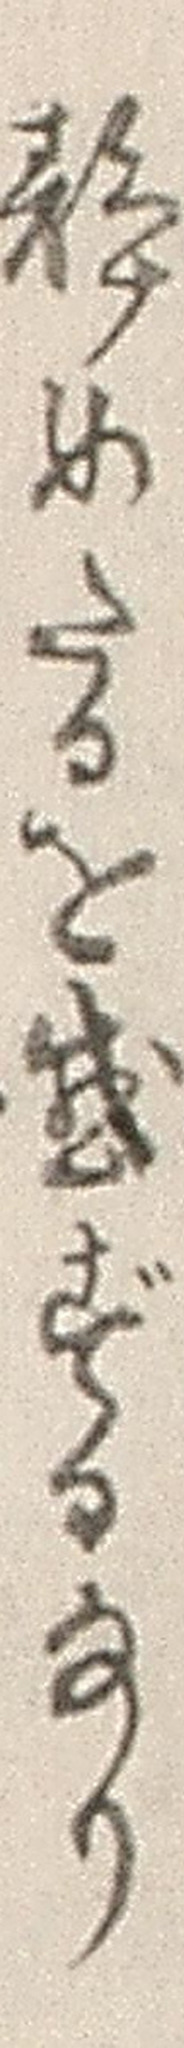静めたるを感ずるなり
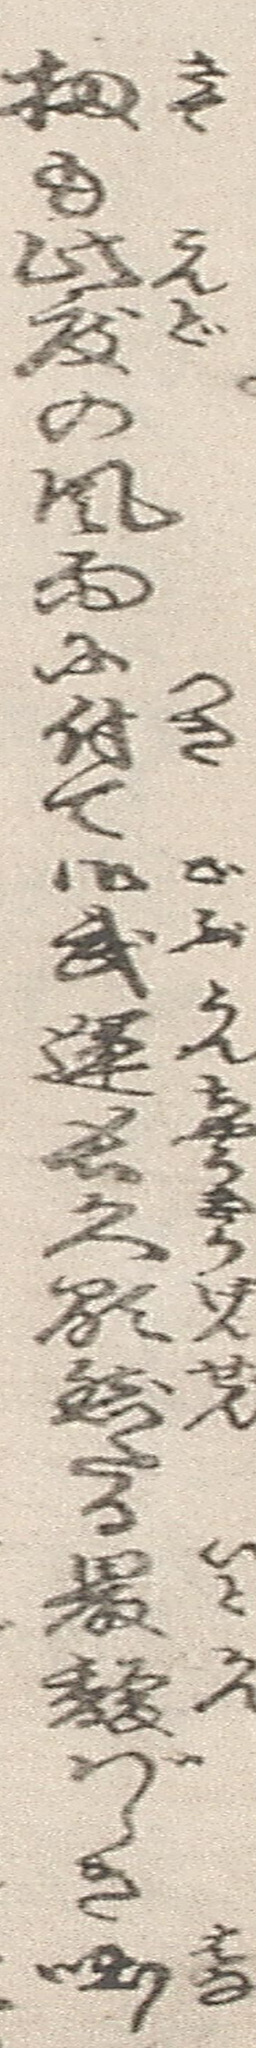扨も此度の風雨に付て御武運長久顕然たる最馥バしき咄し
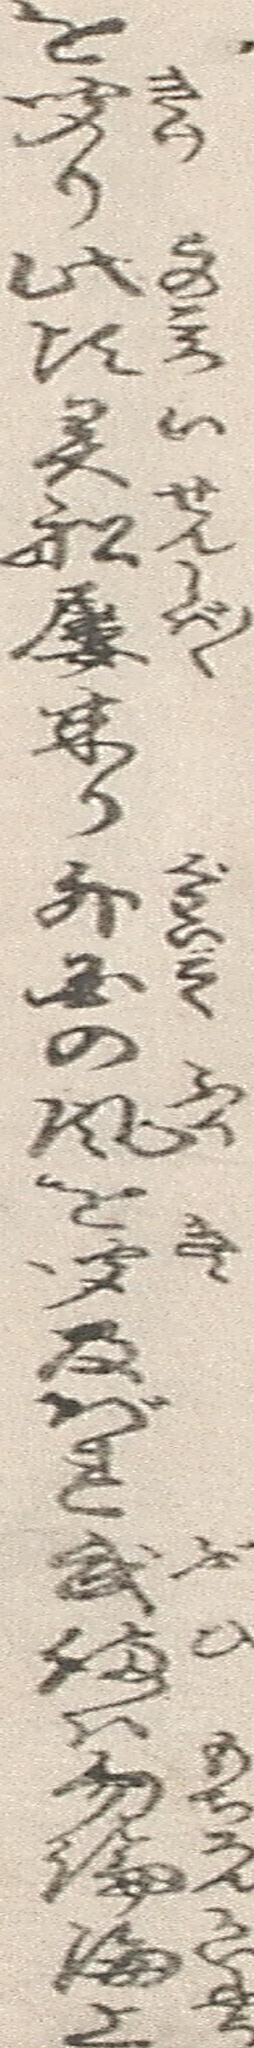を聞り此頃異船屡来り外国の風を聞及バれ武備ハ勿論海上
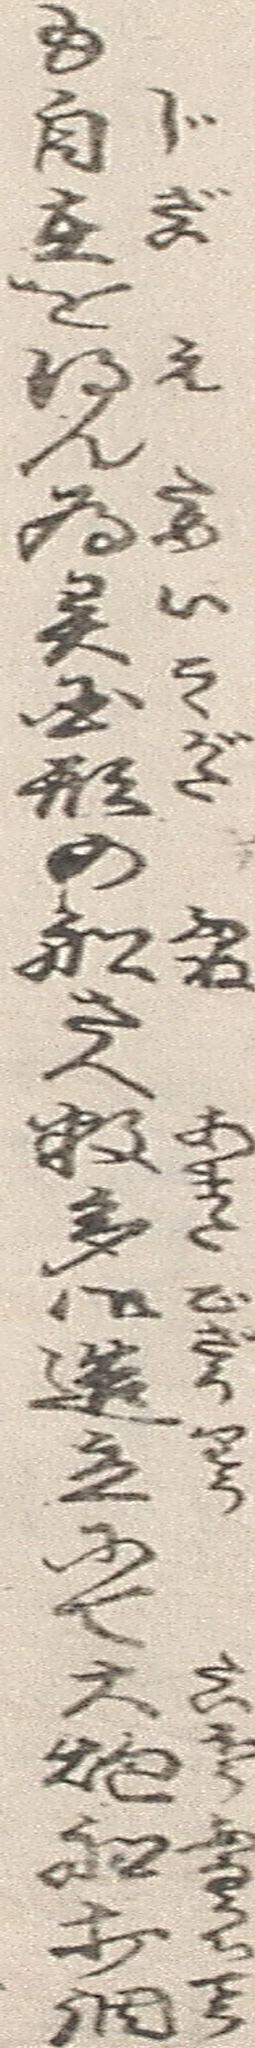も自在を得ん為異国形の船さへ数多御造立にて大炮船打調
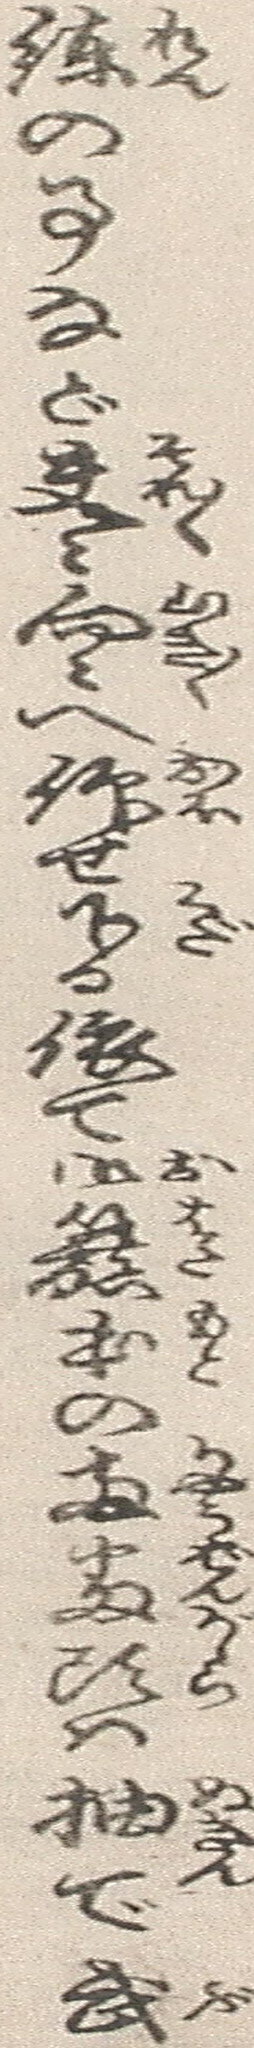錬の事など夫〻向〻へ仰せ下る依て御簱本の両番頭ハ抽で武
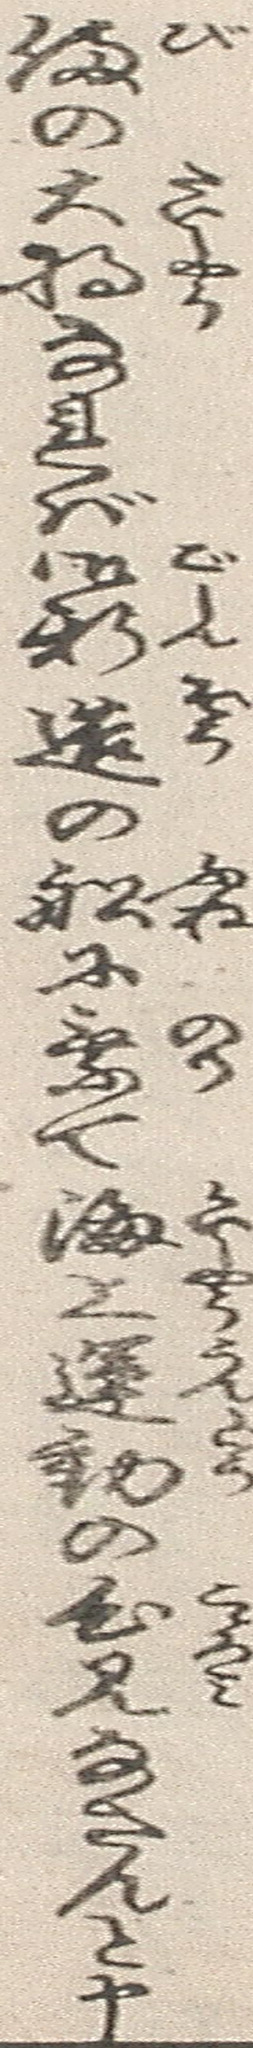備の大将なれバ御新造の船に乗て海上運動の心見なさんと申
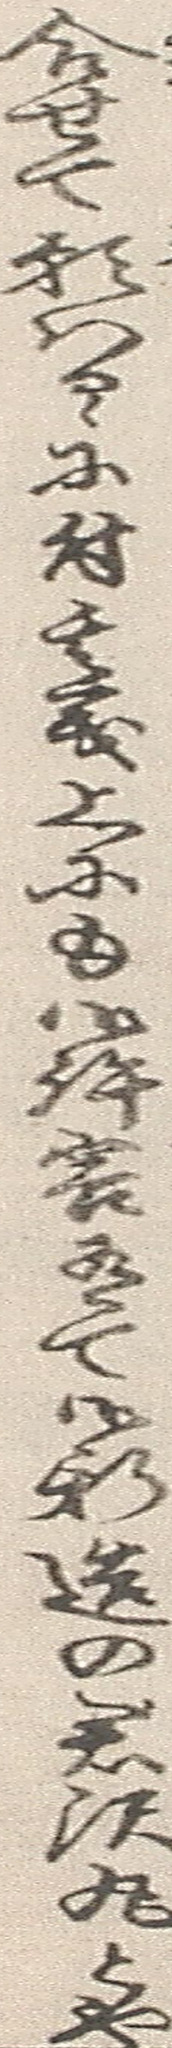合せて願ハるゝに付其義上にも御許容有て御新造の君沢丸とや
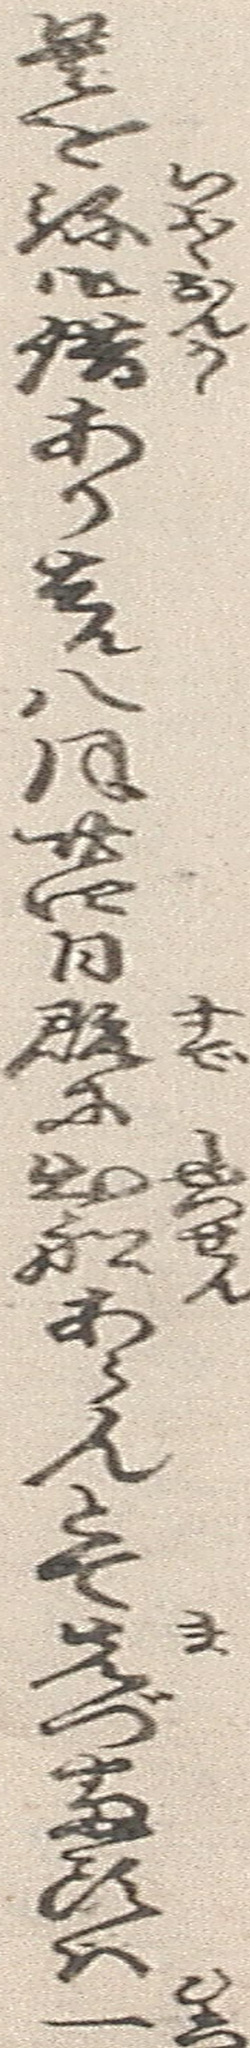是を弥御借あり去ㇽ八月廿四日既に出船あらんとて先づ番頭ハ一
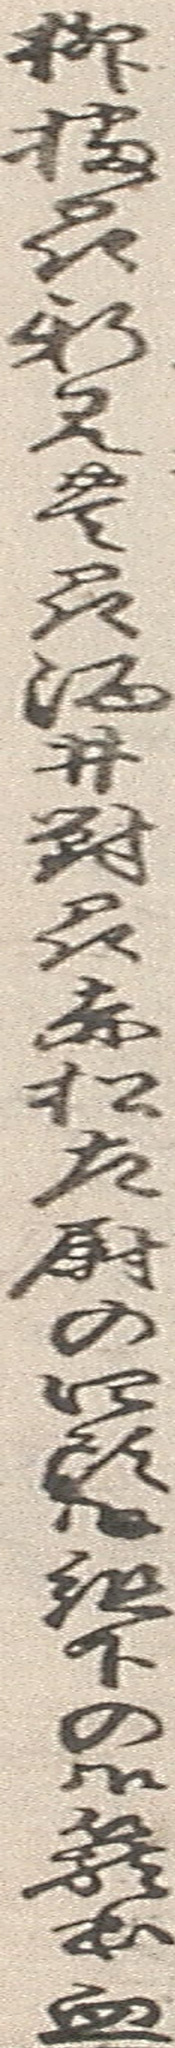柳播州新見豊州酒井對州赤松左尉の四頭御組下の御籏本血
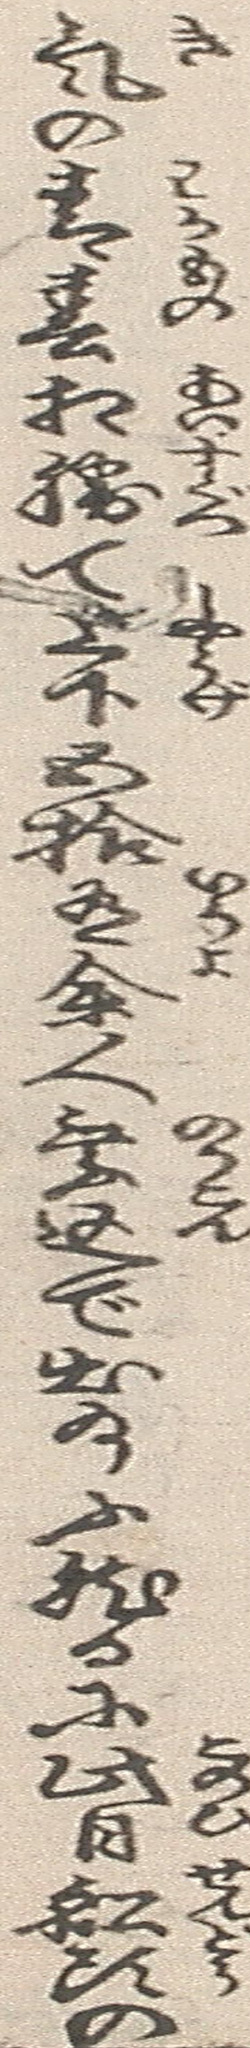気の青春相勝て上下五拾有余人乗込で出給ふ然るに此日船頭の
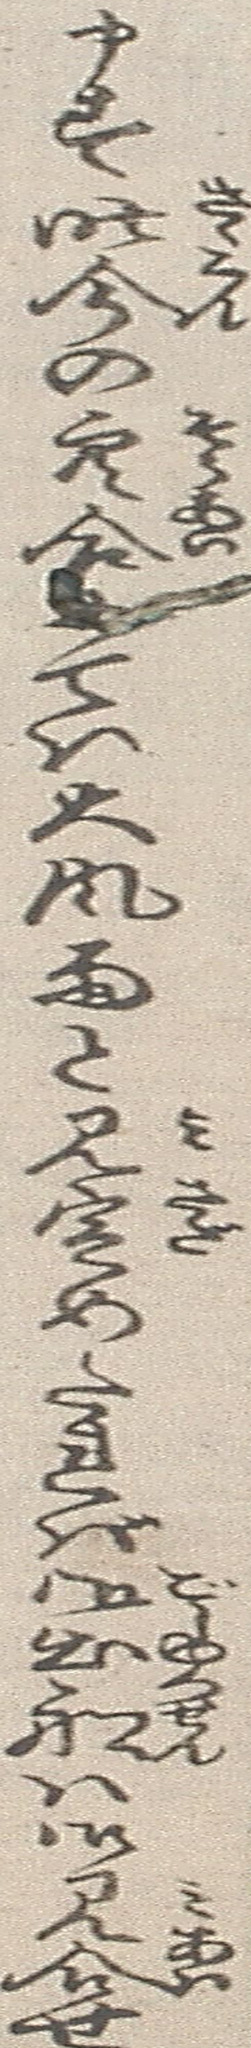申す昨今の空合にてハ大風雨と見定めたれバ御出船ハ御見合せ
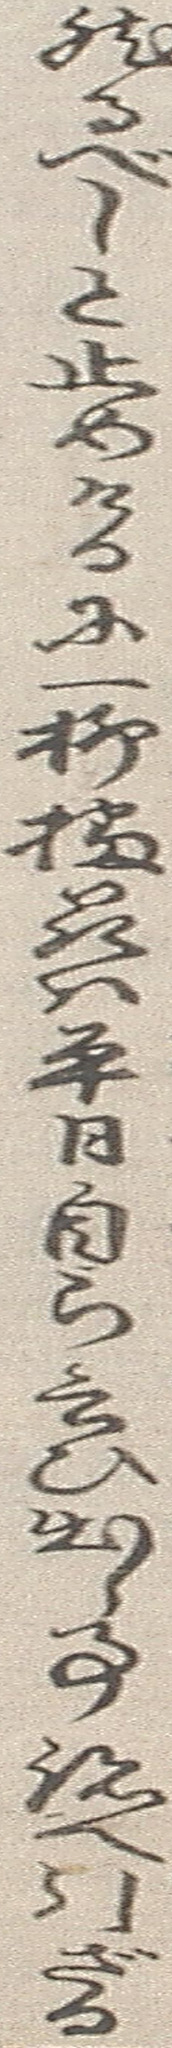然るべしと止めけるに一柳播州ハ平日自ら云ひ出し事跡へ引ざる
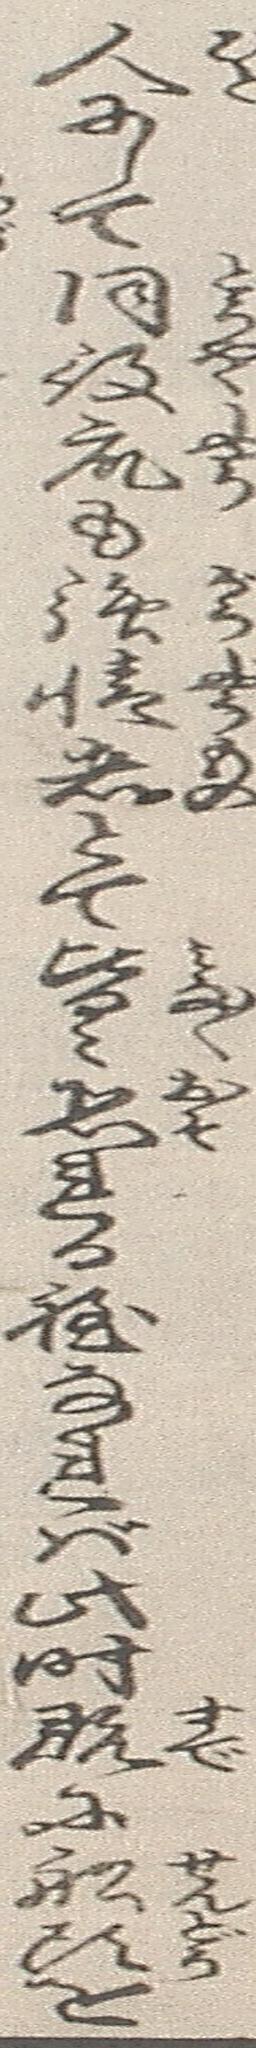人にて同役衆も強情者とて皆々恐れる程なれバ此時既に船頭を
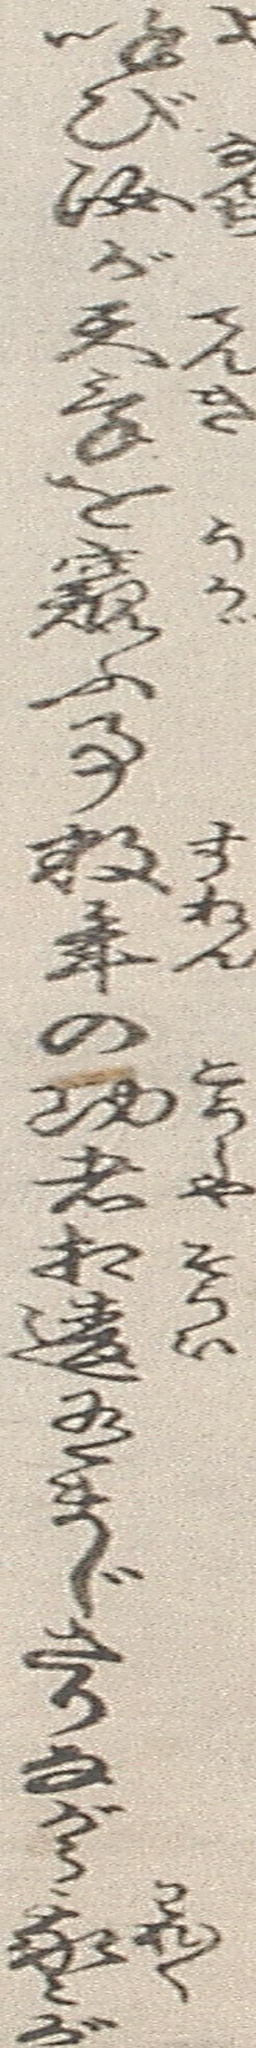呼び汝が天気を窺ふ事数年の功者相違有まじさりながら我々が
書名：安政風聞集　上中下　全
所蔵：東京大学地震研究所図書室 Earthquake Research Institute Library, The University of Tokyo, JAPAN
